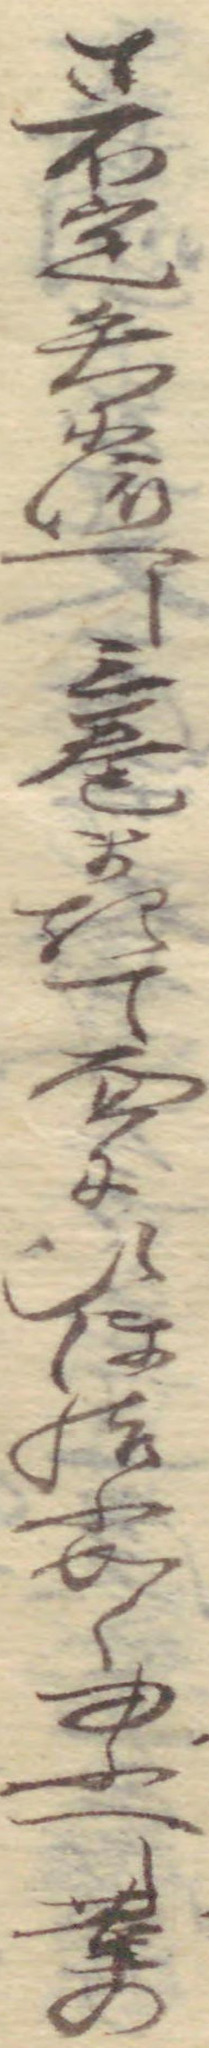さ不定矢に依るへし三巻まきて面にひほ結ふ如くゆふへし革の
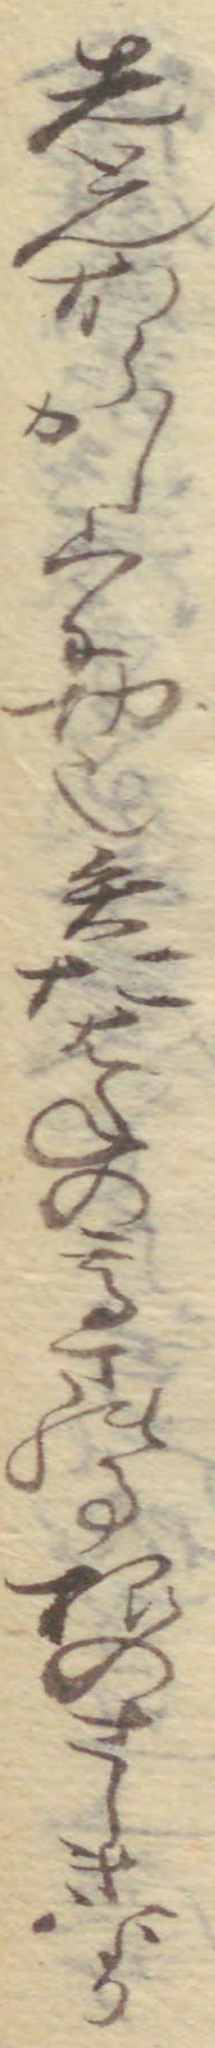先とんほうかしらに切也矢たはねの高さの事根のさしきハより
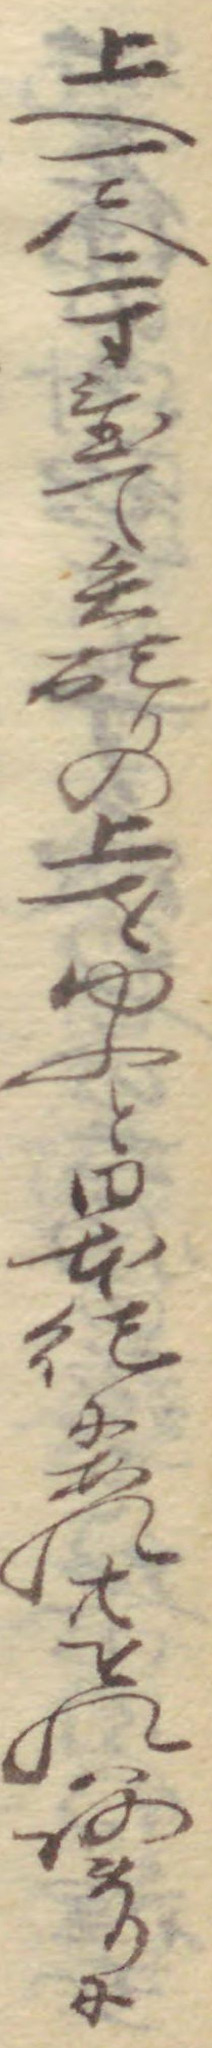上へ一尺二寸置て矢配りの上をゆふと日本紀にあれ共それハあまりに
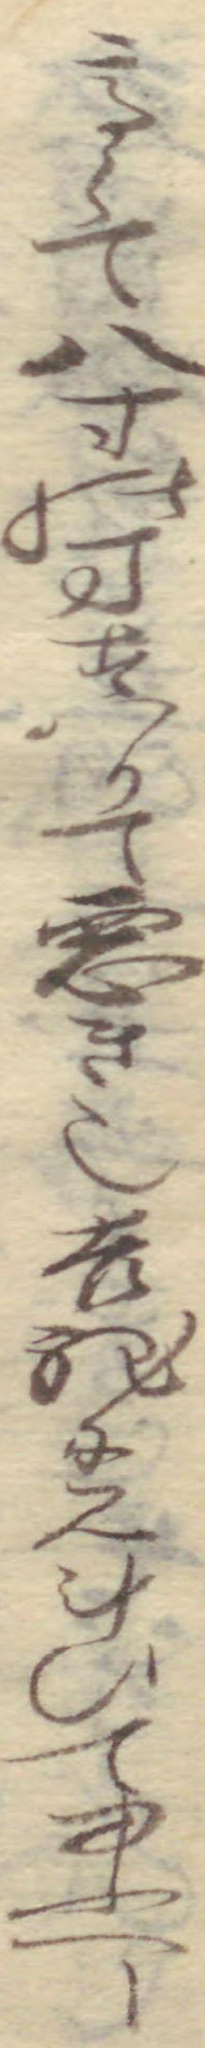高くて八寸の方すはりて悪き也吉程に見斗ひてゆふへし
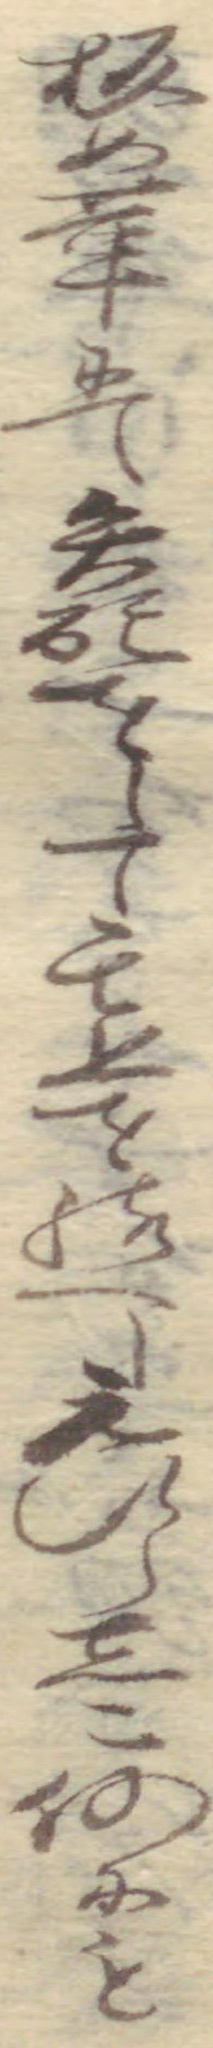板め革にて矢配をして其上を結へしえひらしこ何にも
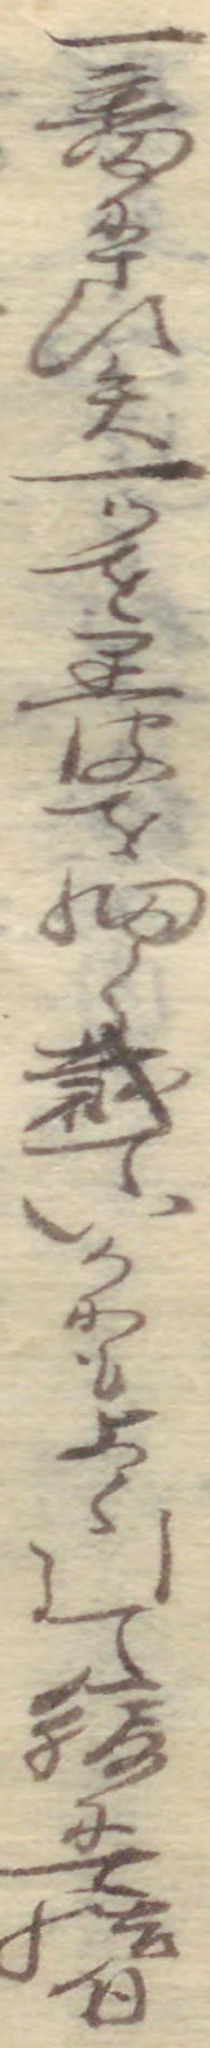一番にさす矢一ツを黒皮を細く裁ていかにもよく引て箙に可結付
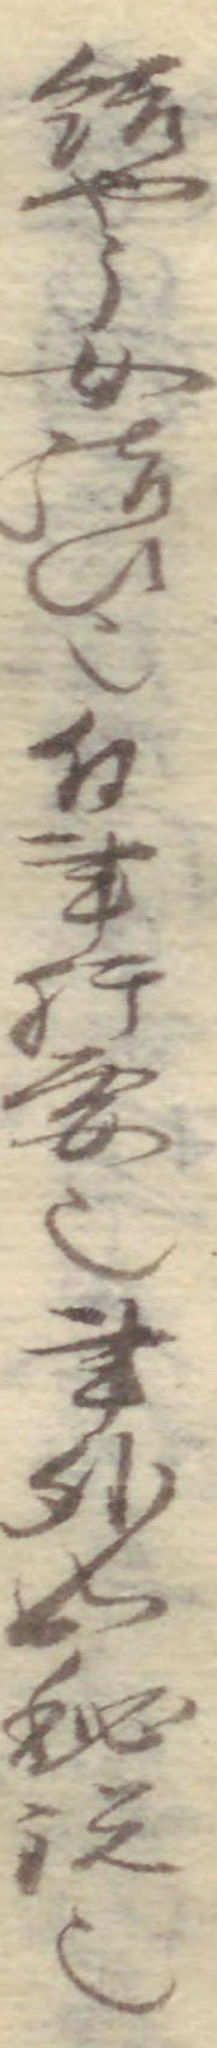結やう女結ひ也付事肝要也事外成秘説也
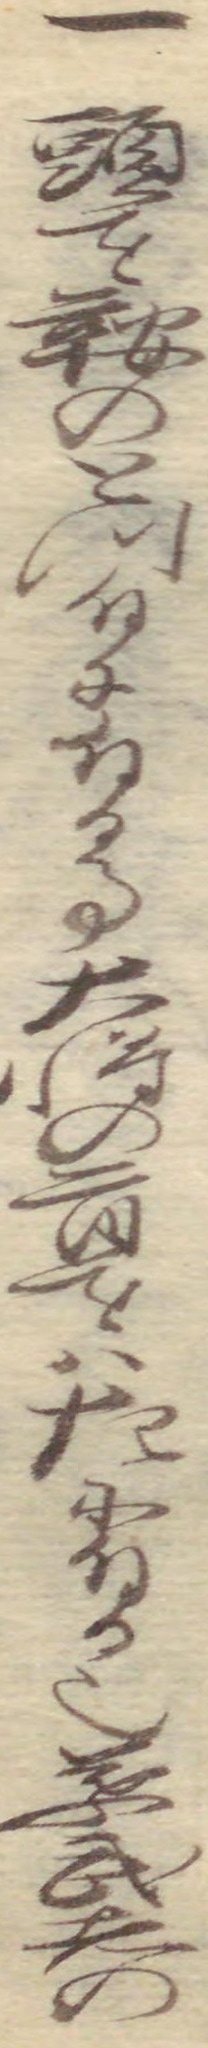一頭を鞍のとつ付に付る事大将の首をハ左に付る也葉武者の
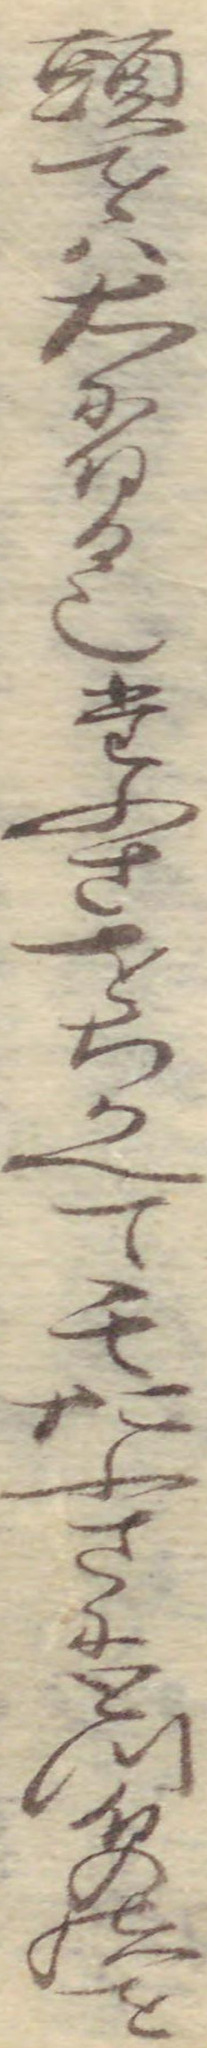頭をハ右に付る也たふさをちかへて其たふさにとつ付の緒を
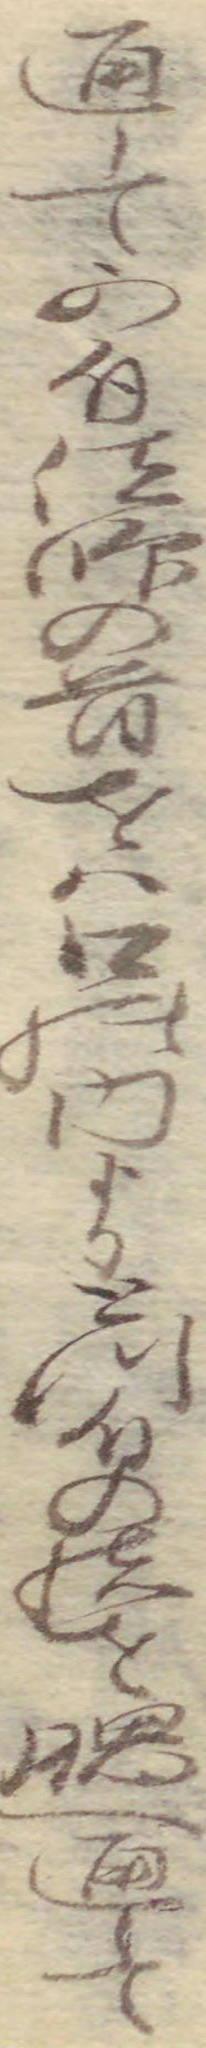通して可付法師の首をハ口の内よりとつ付の緒を腮へ通して
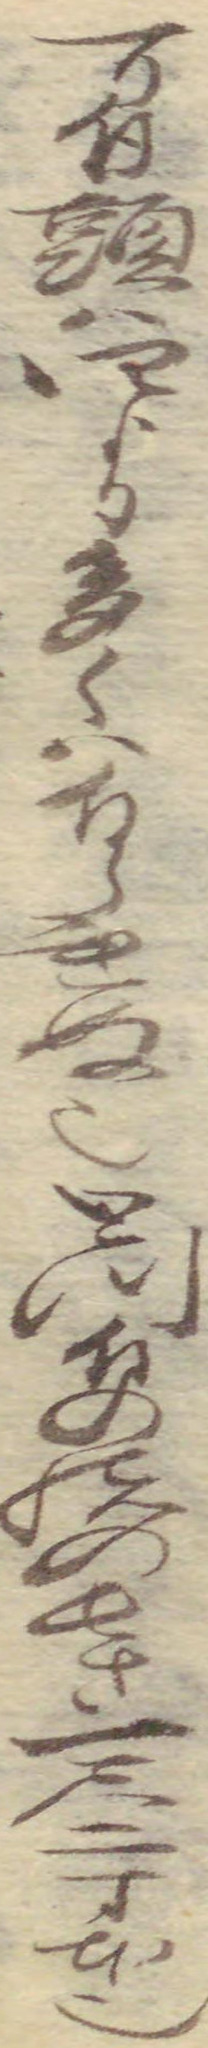可付頭ハ四より多くハ付られぬ也とつ付の緒の長さ一尺二寸本也
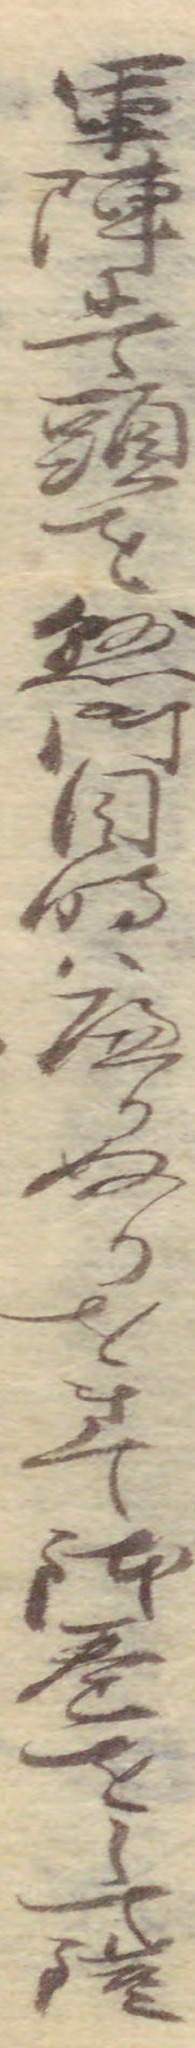一軍陣にて頭を懸御目時ハへりぬりをきて鉢巻きをして鎧
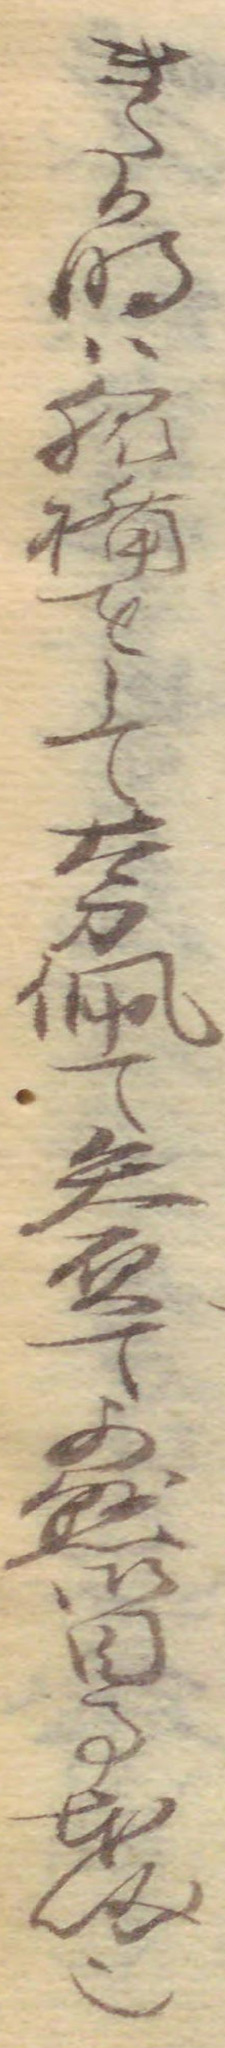きたる時ハ脇楯をして太刀佩て矢負て可懸御目事本儀也

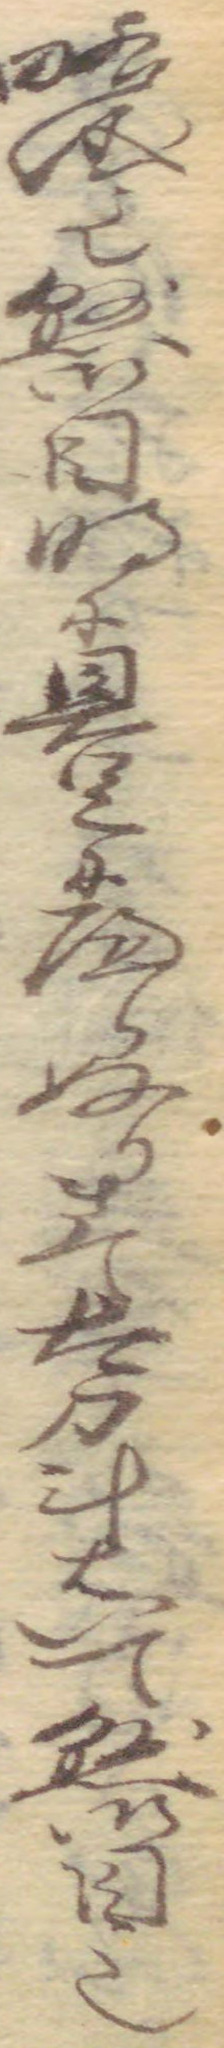略儀ニて懸御目時に具足にへりぬりきて太刀斗はいて懸御目也
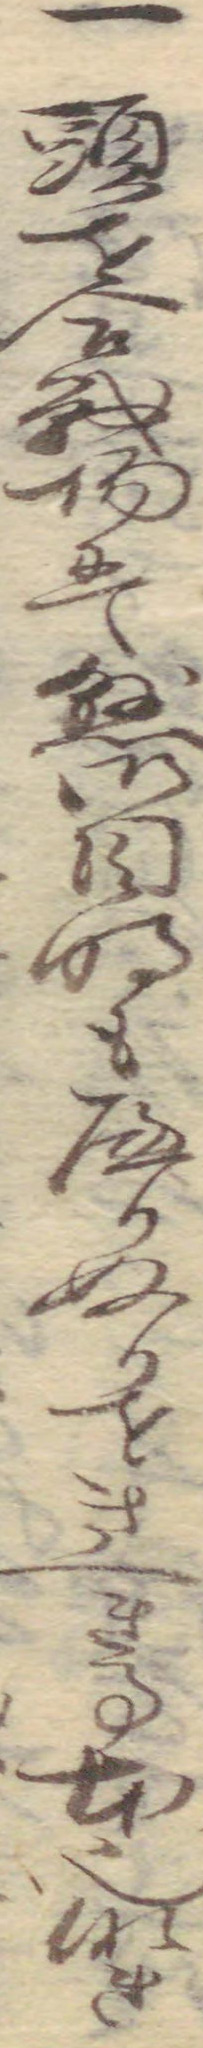一頭を合戦場にて懸御目時もへりぬりをきへき事本也なき
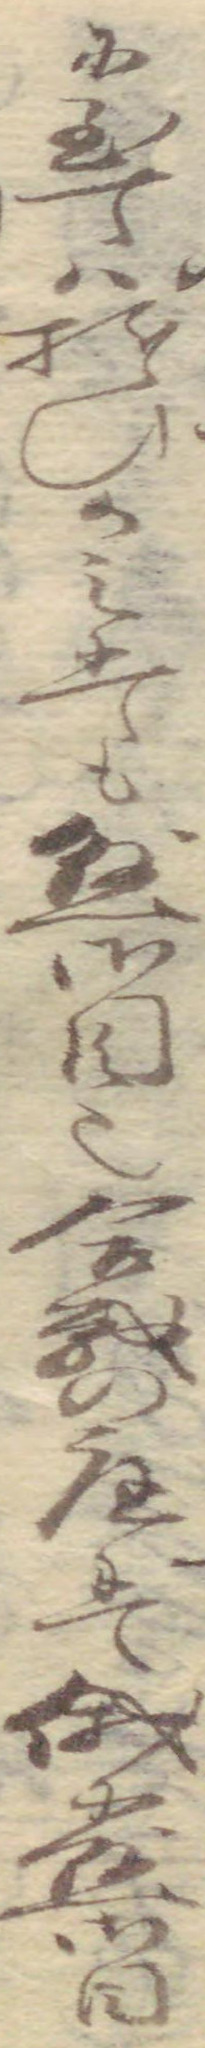に至てハ結かミにても懸御目也合戦の庭にて俄に懸御目
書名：鶯宿雑記. 巻199-200
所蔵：国立国会図書館 National Diet Library, JAPAN
